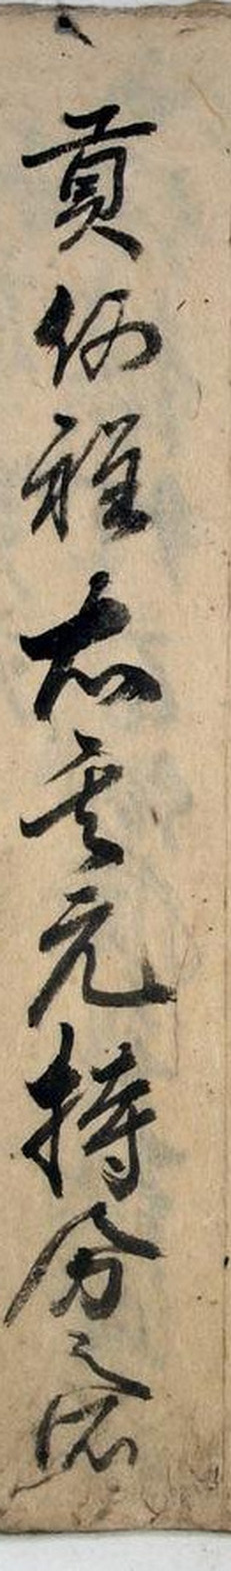貢何程右其元持分之所

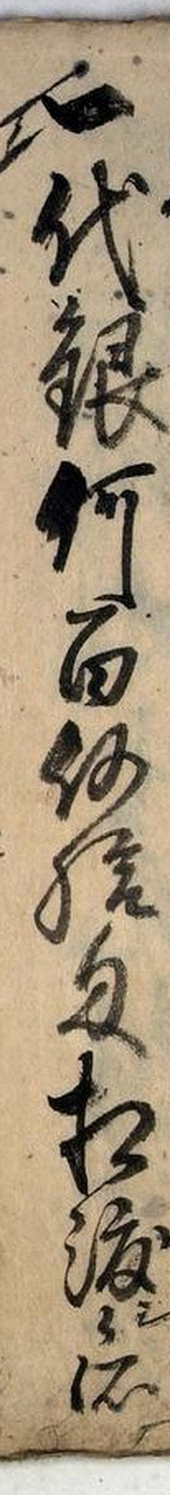一代銀何百何拾匁相渡シ候所
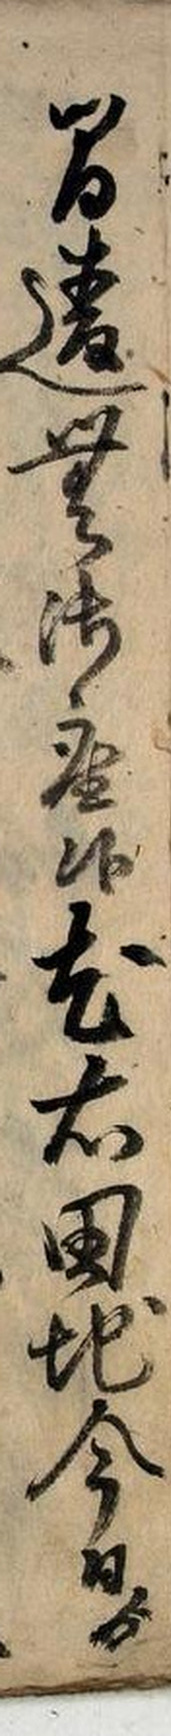間違無御座候尤右田地今日ゟ
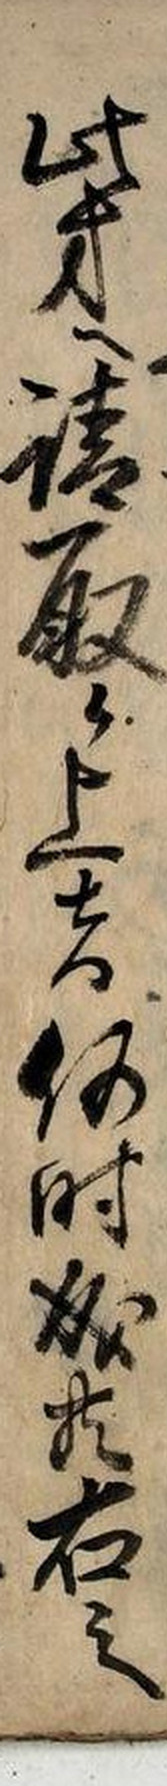此方へ請取候上は何時成共右之
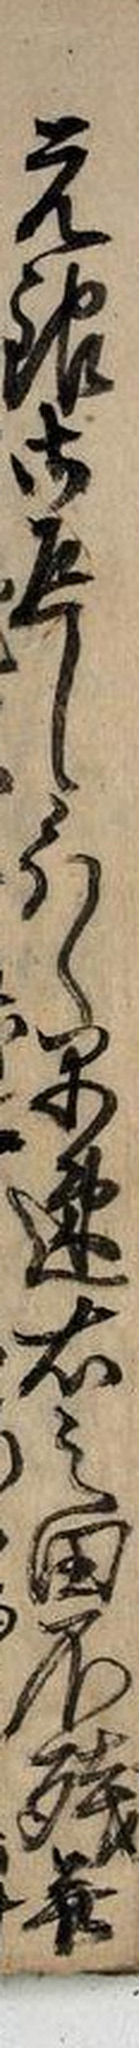元銀御返し候ハヽ早速右之田不残幷
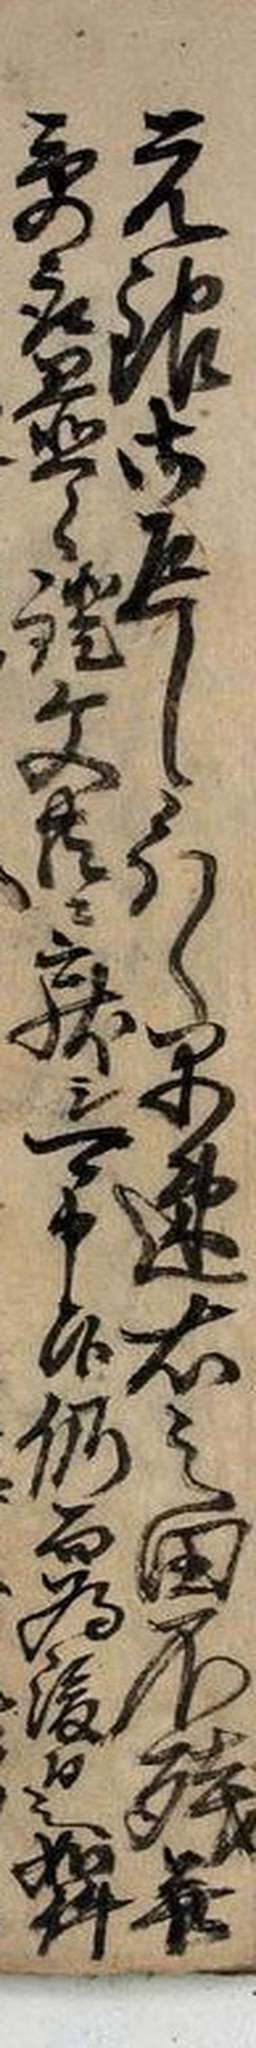受取置候証文共ニ戻シ可申候仍而為後日之如件
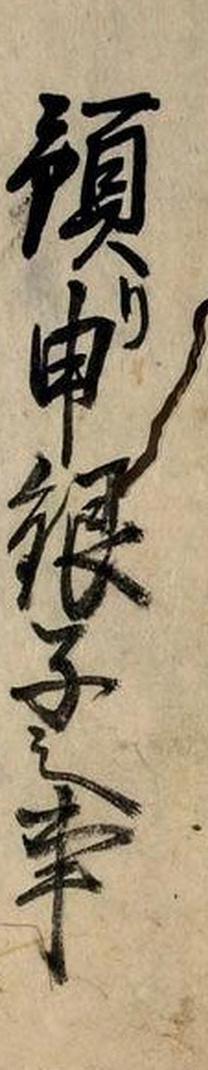預リ申銀子之事
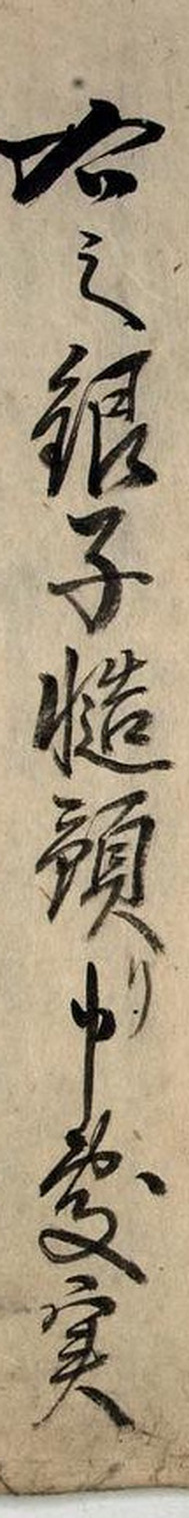右之銀子慥預リ申処実

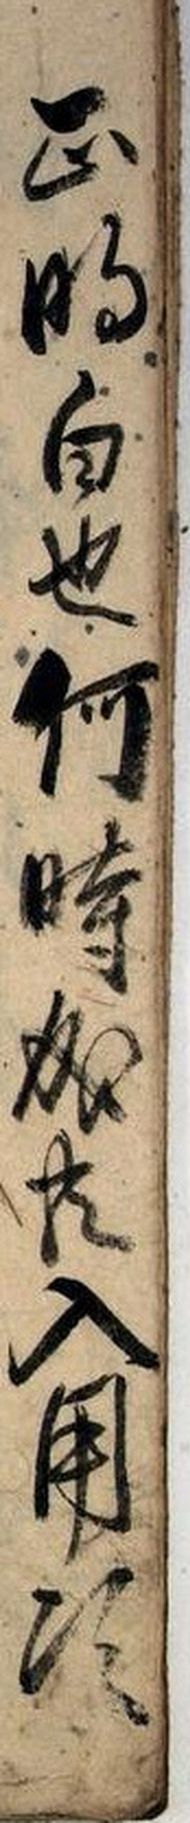正明白也何時成共入用次
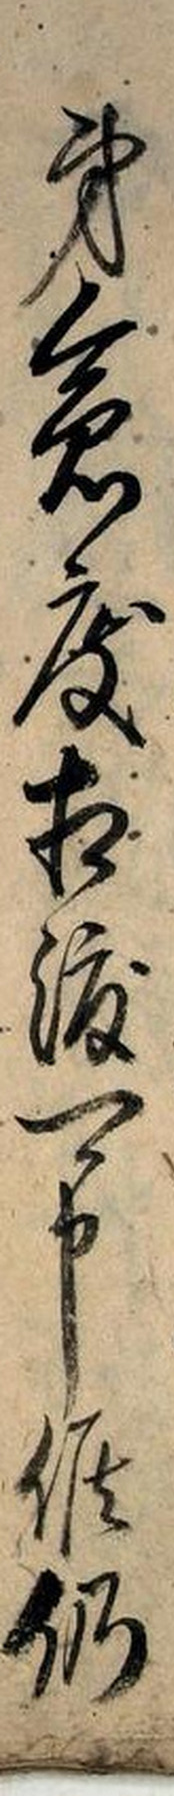第急度相渡可申候仍
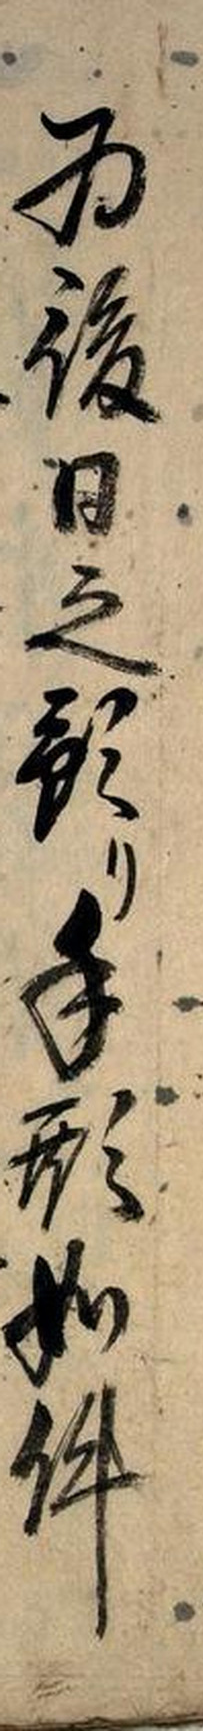為後日之預リ手形如件
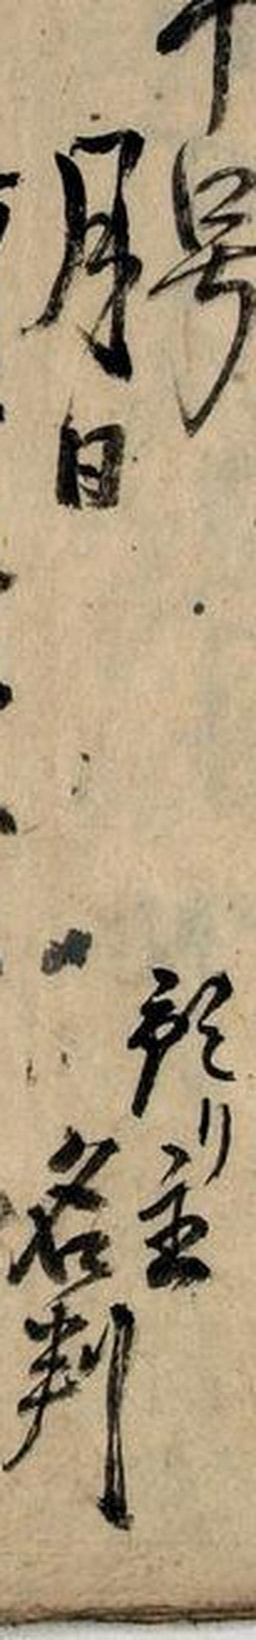月日名判
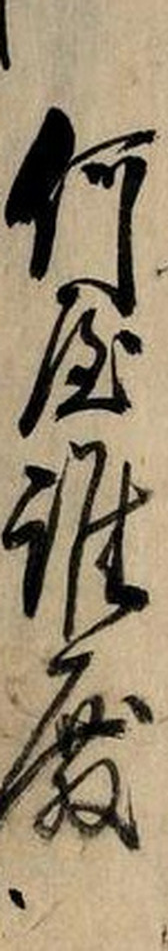何屋誰殿
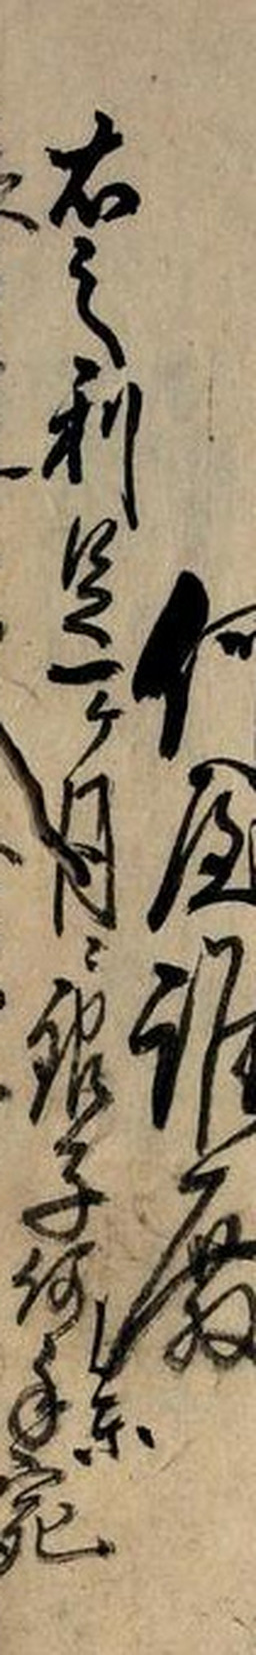右之利足一ヶ月ニ銀子何宛
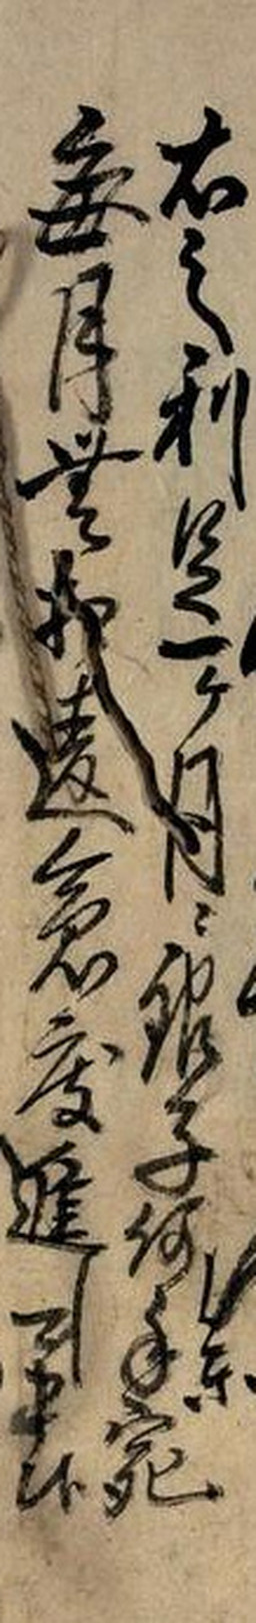毎月無相違急度進し可申候
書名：証文御手本（手習）
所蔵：福井県文書館 Fukui Prefectural Archives
